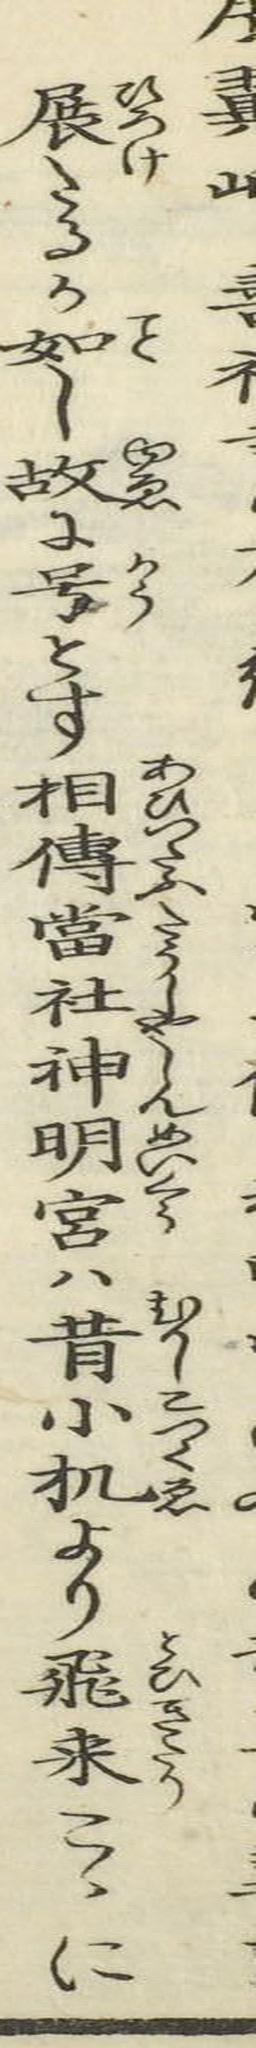展たるか如し故に号とす相伝当社神明宮は昔小机より飛来こゝに
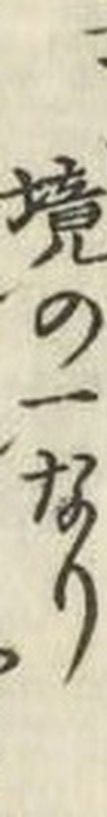十境の一なり
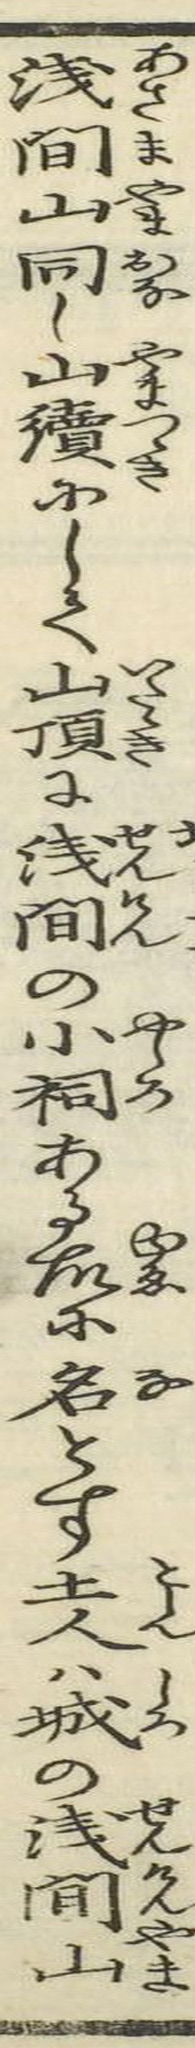浅間山同し山続にして山頂に浅間の小祠ある故に名とす土人は城の浅間山
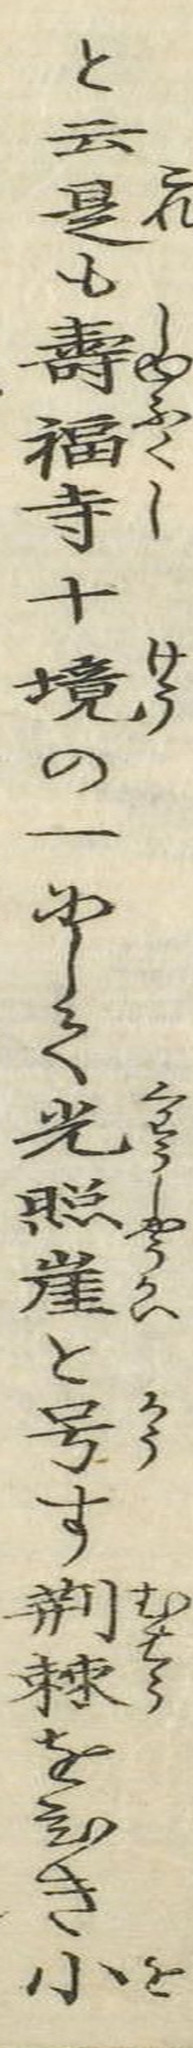と云是も寿福寺十境の一にして光照崖と号す荊棘をひき小
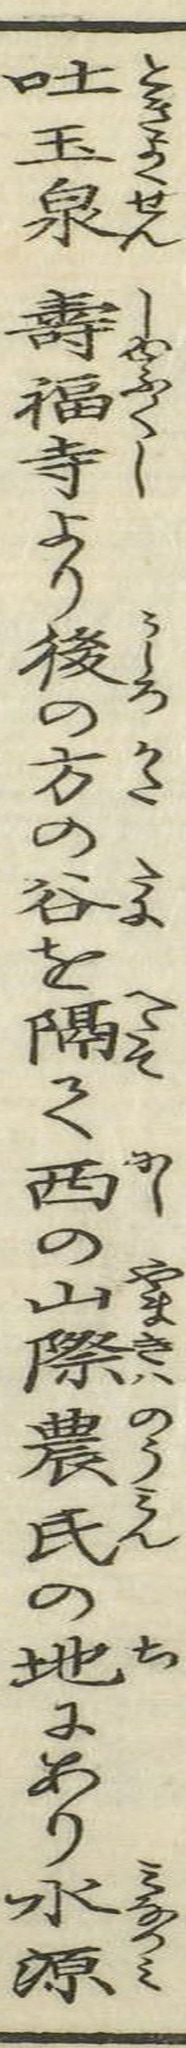吐玉泉寿福寺より後の方の谷を隔て西の山際農民の地にあり水源
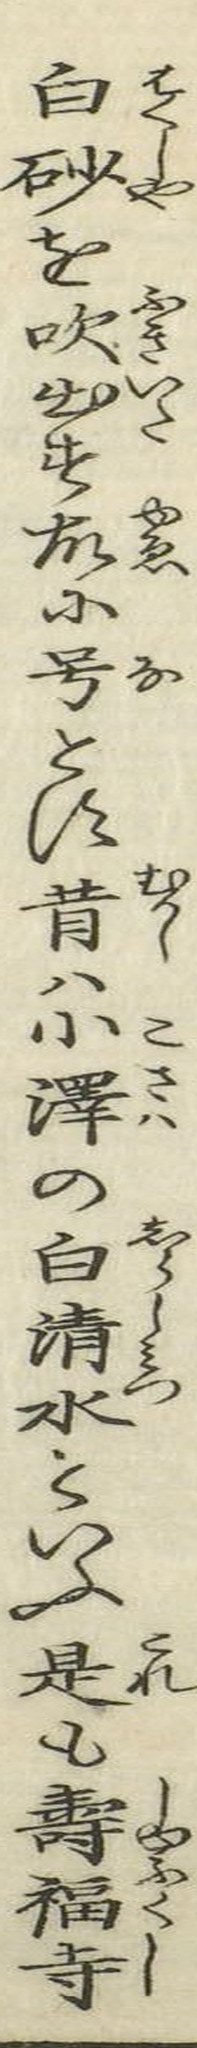白砂を吹出す故に号とす昔は小沢の白清水といふ是も寿福寺
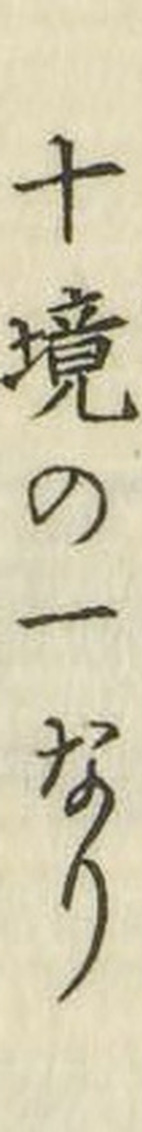十境の一なり
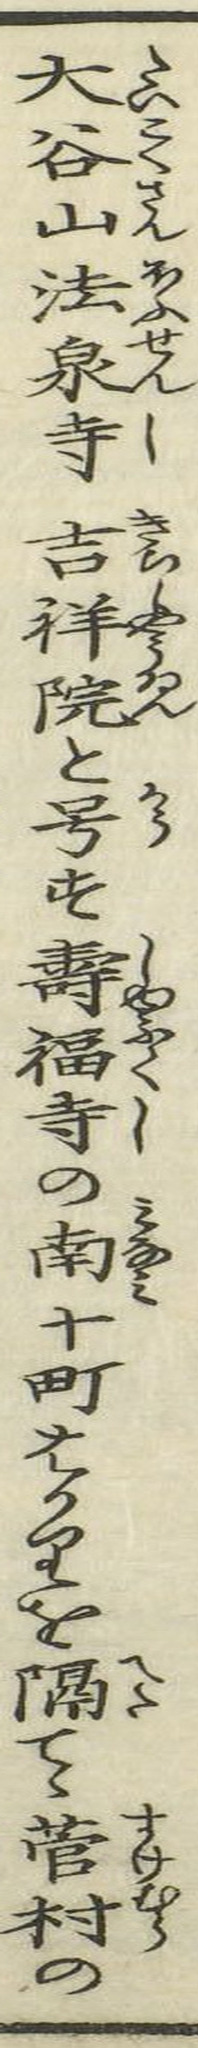大谷山法泉寺吉祥院と号す寿福寺の南十町はかりを隔てゝ菅村の
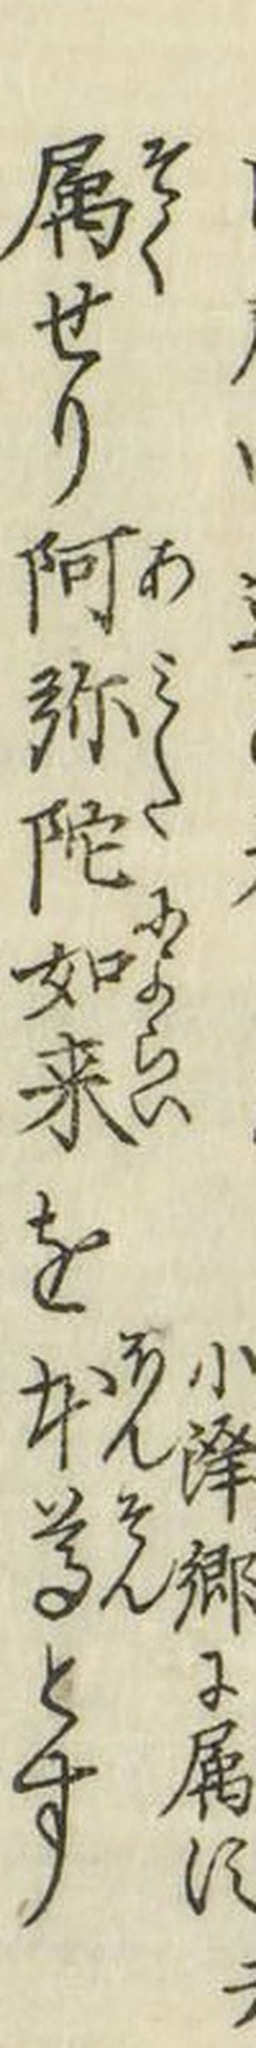属せり阿弥陀如来を本尊とす
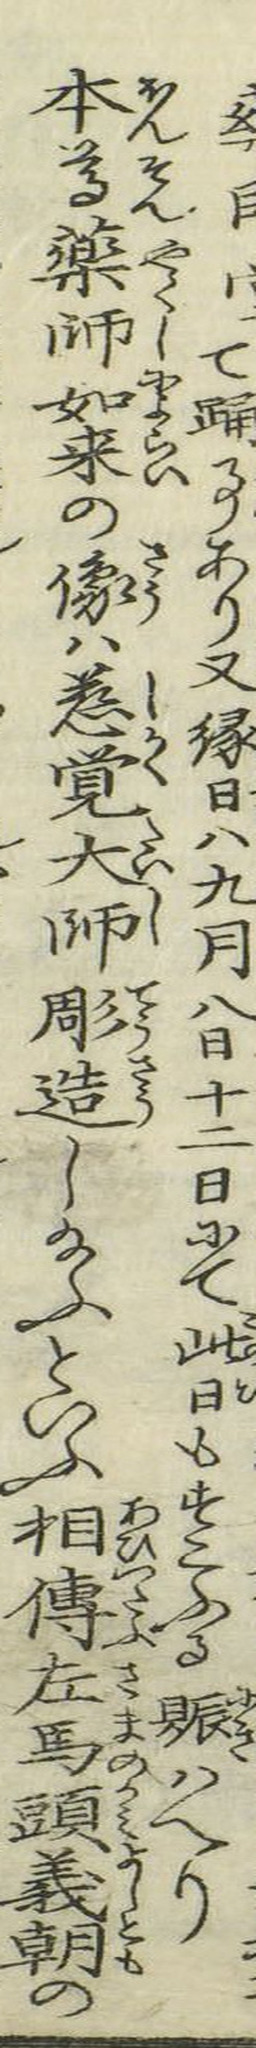本尊薬師如来の像は慈覚大師彫造し給ふといふ相伝左馬頭義朝の
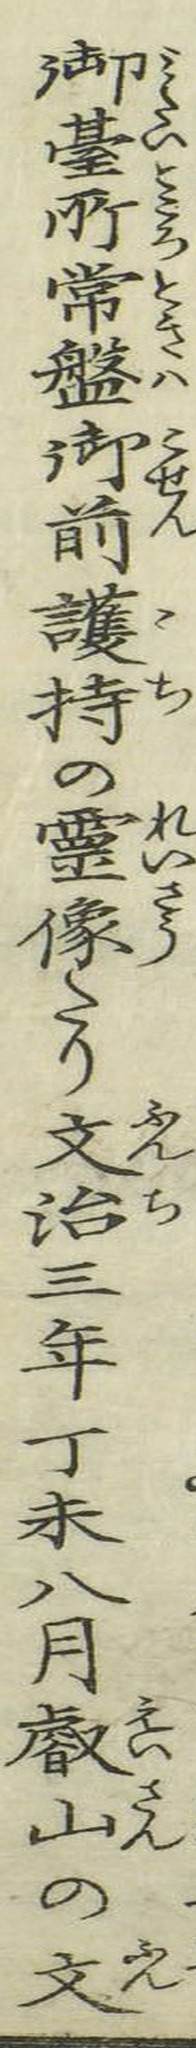御台所常盤御前護持の霊像たり文治三年丁未八月叡山の文

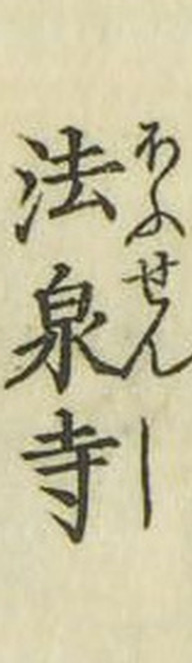法泉寺

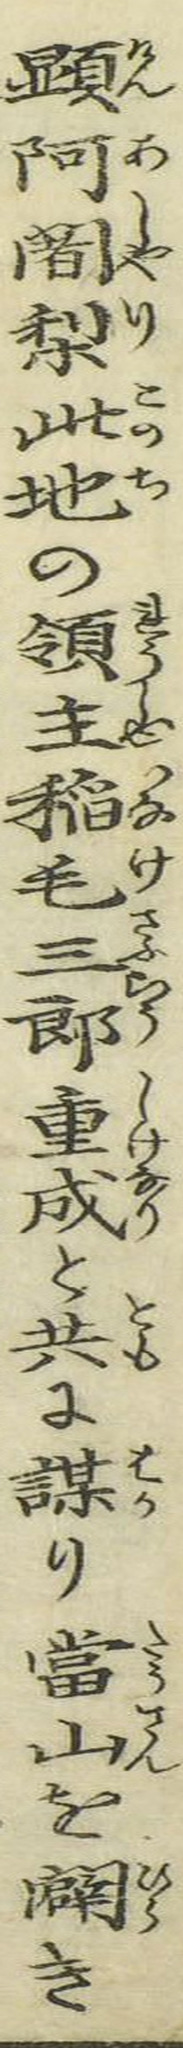顕阿闍梨此地の領主稲毛三郎重成と共に謀り当山を闢き
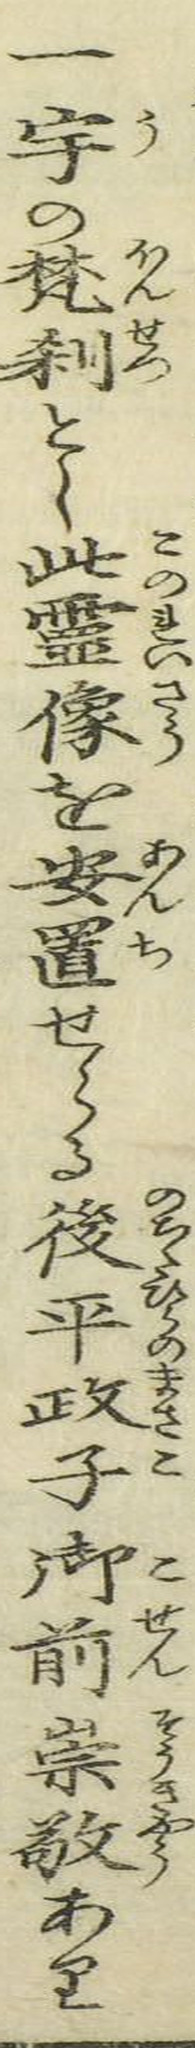一宇の梵刹とし此霊像を安置せらる後平政子御前崇敬あり
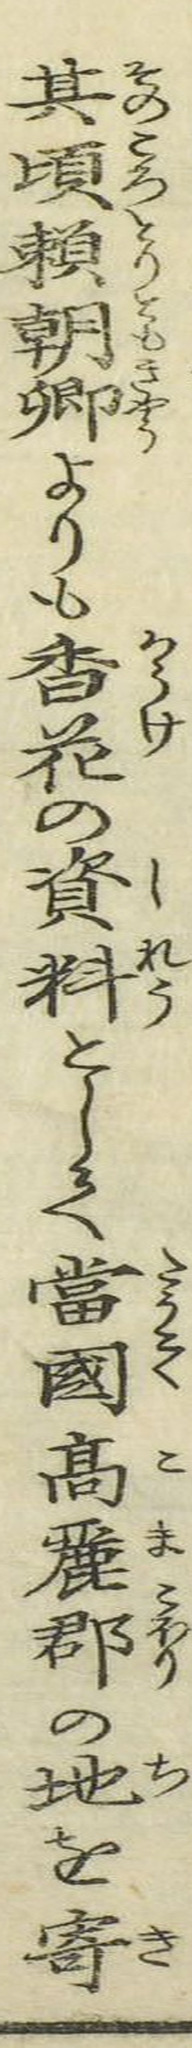其頃頼朝卿よりも香花の資料として当国高麗郡の地を寄
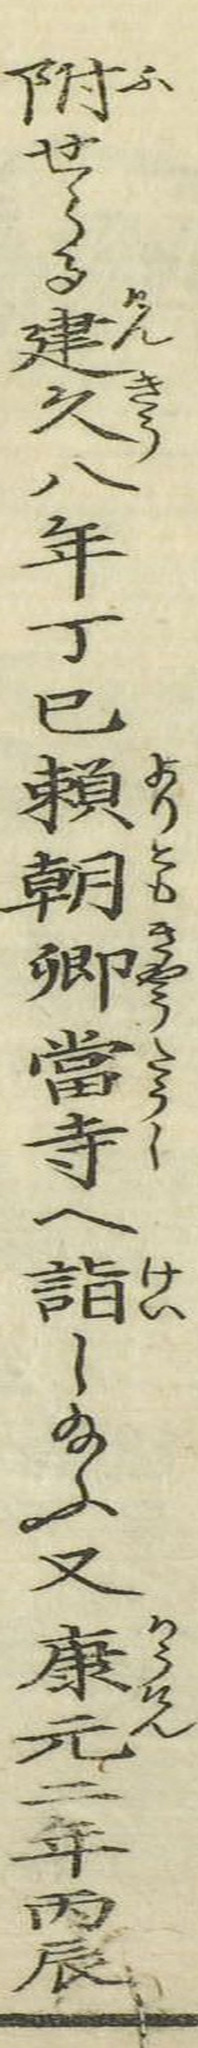附せらる建久八年丁巳頼朝卿当寺へ詣し給ふ又康元二年丙辰
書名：江戸名所図会 20巻 巻之10
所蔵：東京学芸大学教育コンテンツアーカイブ
